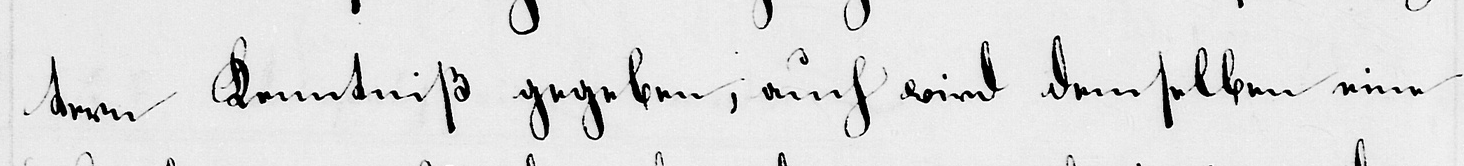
tern Kenntniß gegeben, auch wird demselben eine
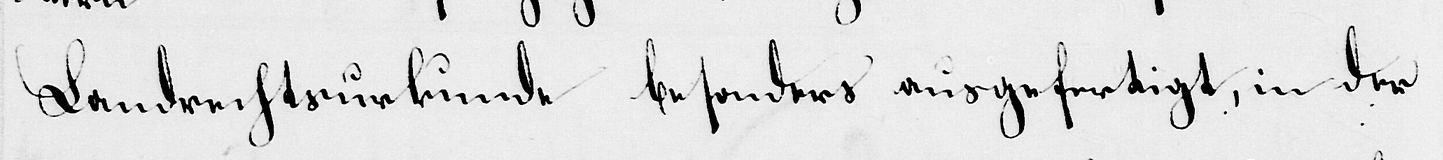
Landrechtsurkunde besonders ausgefertigt, in der
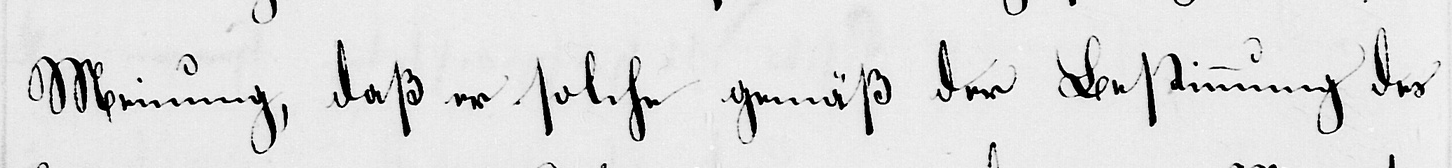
Meinung, daß er solche gemäß der Bestimmung des
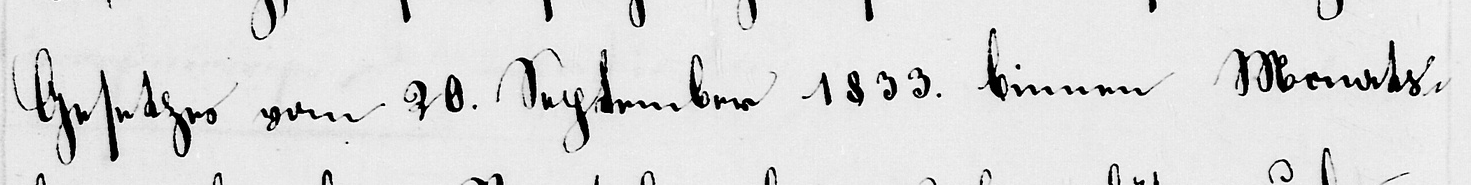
Gesetzes vom 20. September 1833. binnen Monats¬
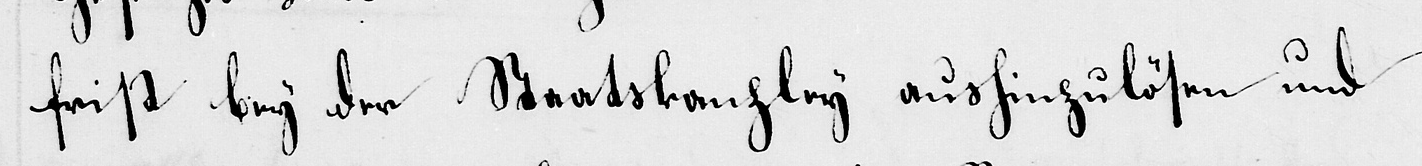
frist bey der Staatskanzley aushinzulösen und
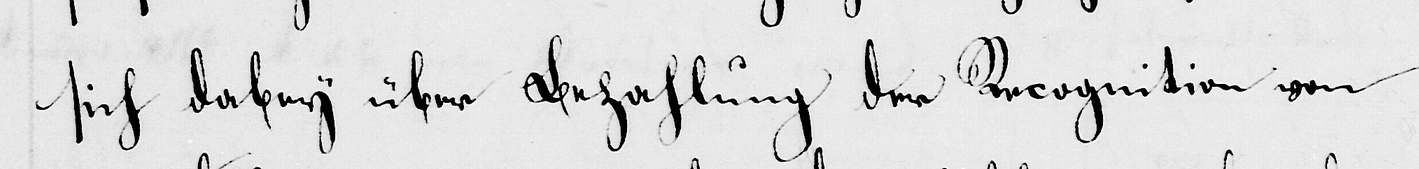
sich dabey über Bezahlung der Recognition von
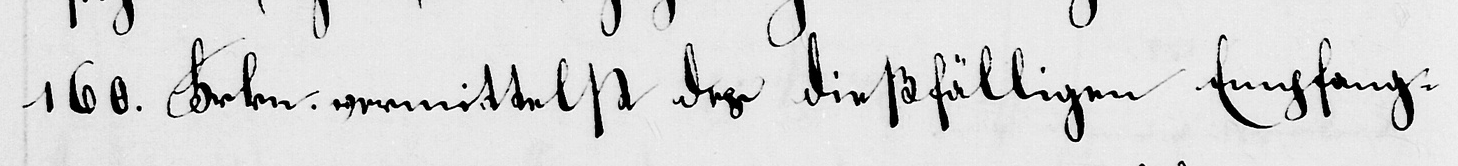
160. Frkn. vermittelst des dießfälligen Empfang¬
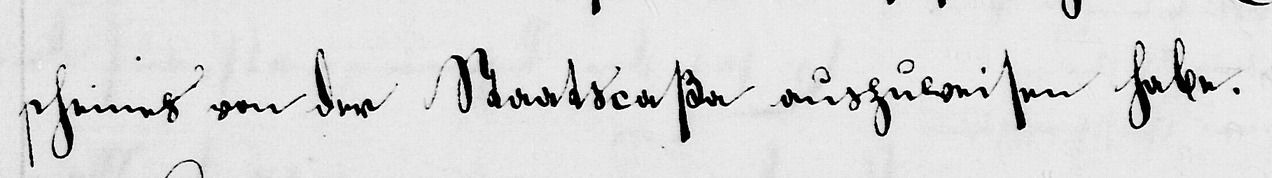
scheines von der Staatscaßa auszuweisen habe.
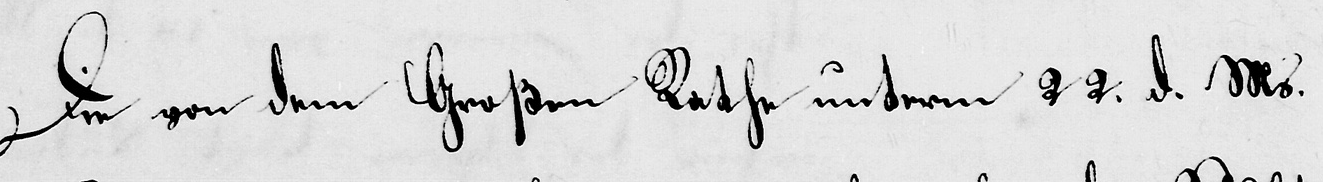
Die von dem Großen Rathe unterm 22. d. Ms.
